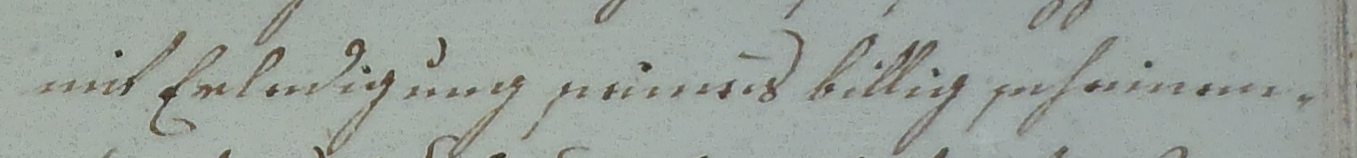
mit Erledigung seines billig scheinen¬
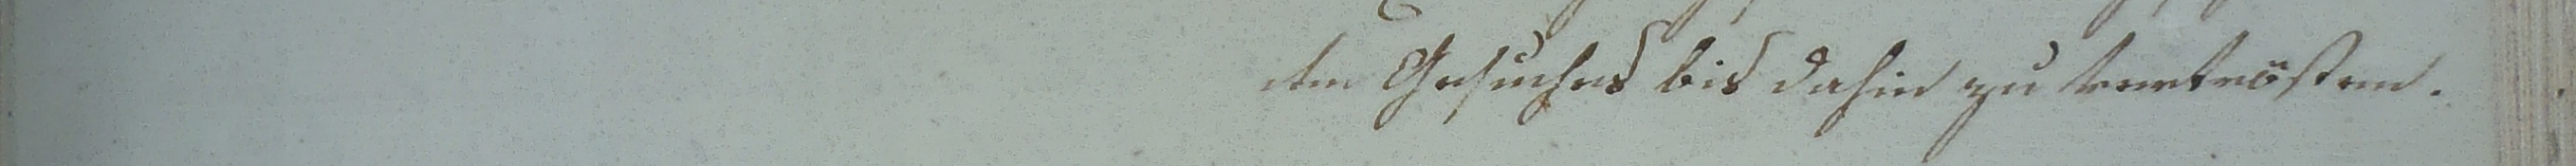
den Gesuches bis dahin zu vertrösten.
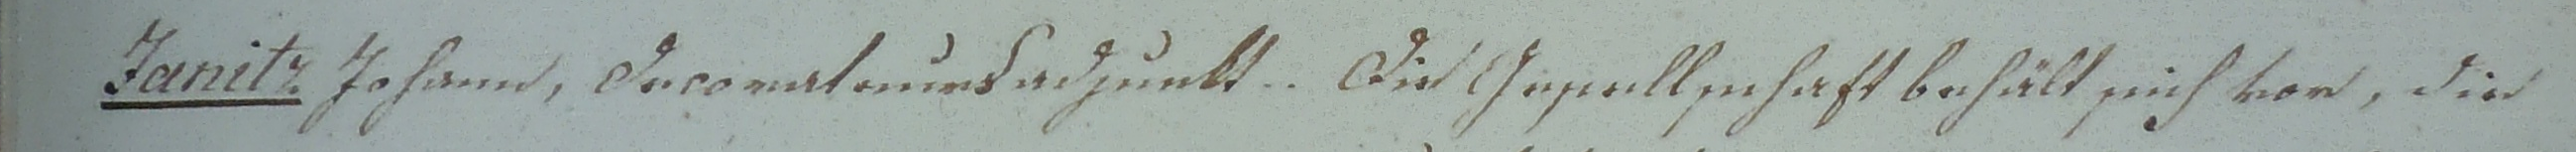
Janitz Johann, Decorateursadjunkt .. Die Gesellschaft behält sich vor, die
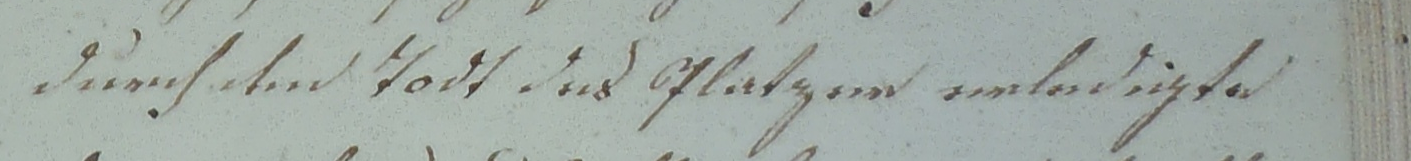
durch den Todt des Platzer erledigte
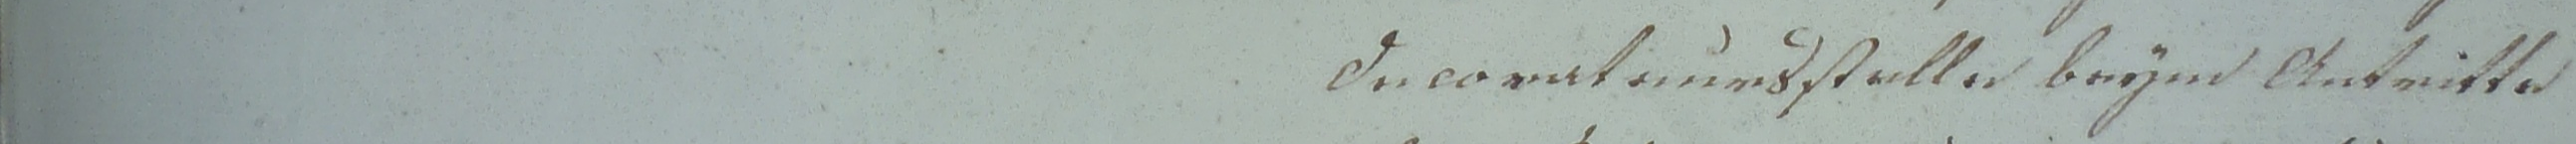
Decorateursstelle beym Antritte
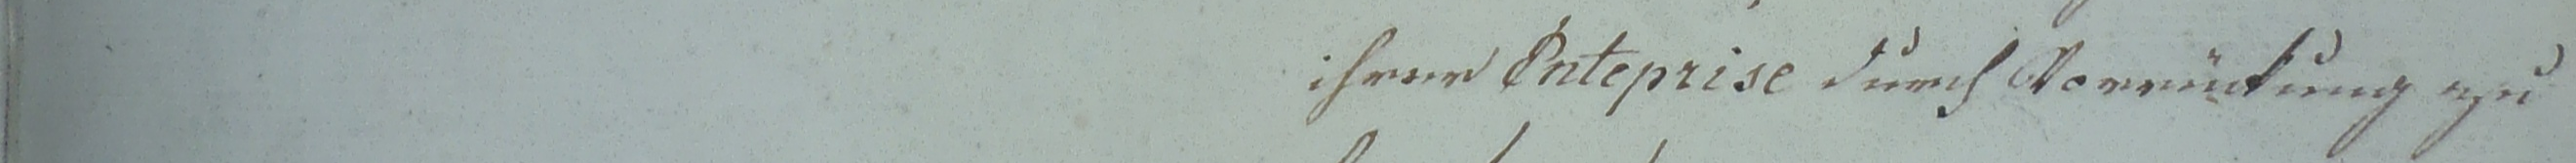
ihrer Enteprise durch Vorrückung zu
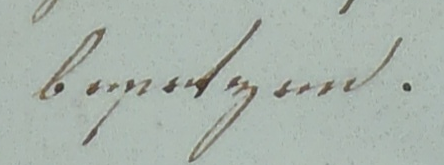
besetzen.
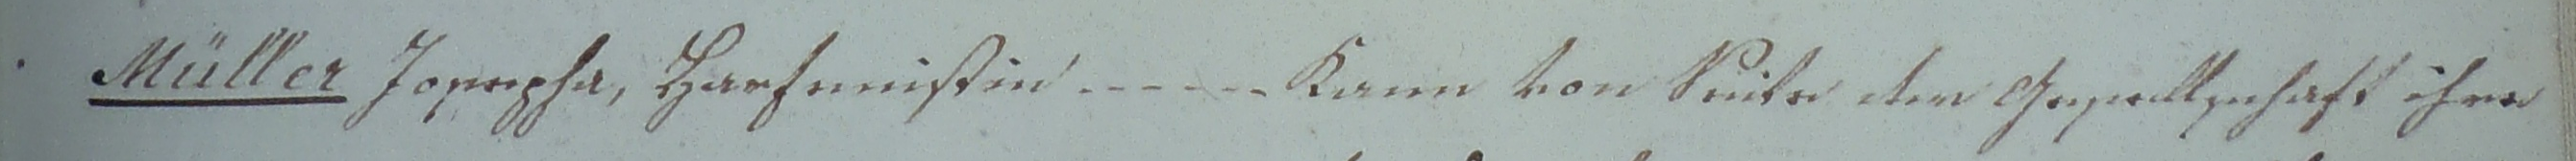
Müller Josepha, Harfinistin ...... Kann von Seite der Gesellschaft ihre
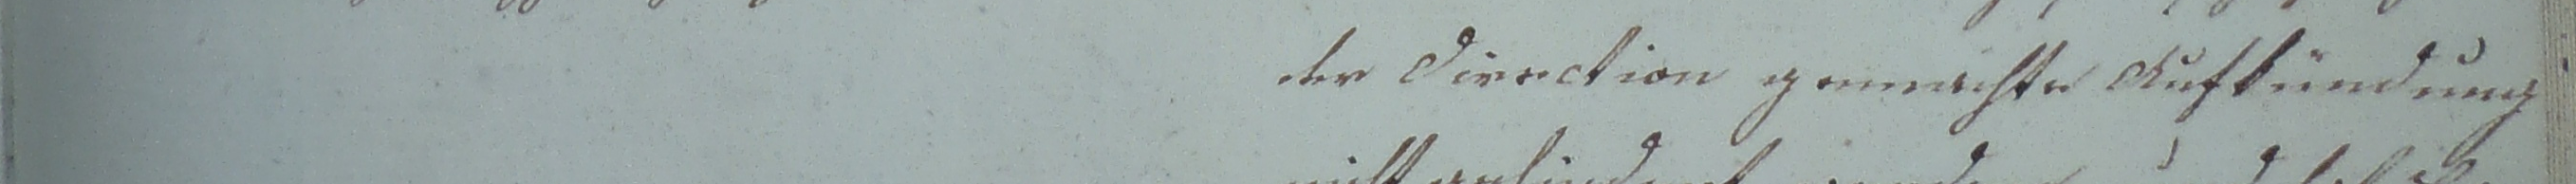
der Direction gemachte Aufkündung
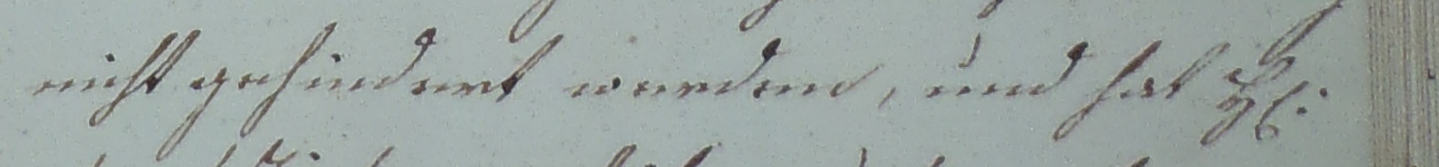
nicht gehindert werden, und hat HE:
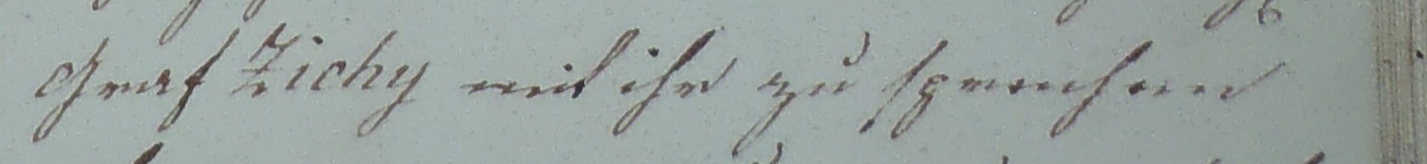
Graf Zichy mit ihr zu sprechen
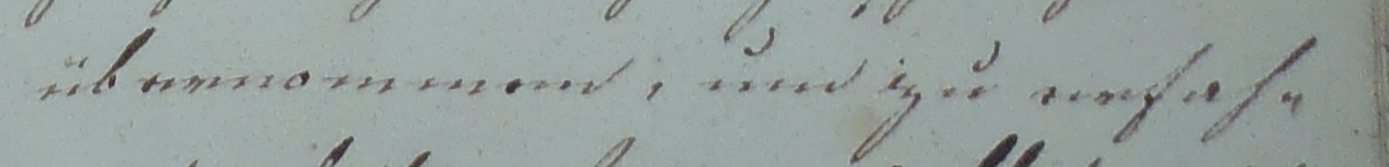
übernommen, um zu erfah¬
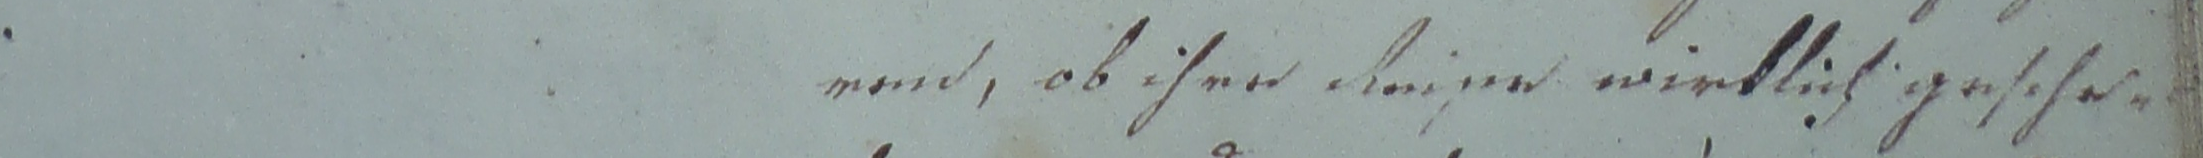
ren, ob ihre Reise wirklich gesche¬
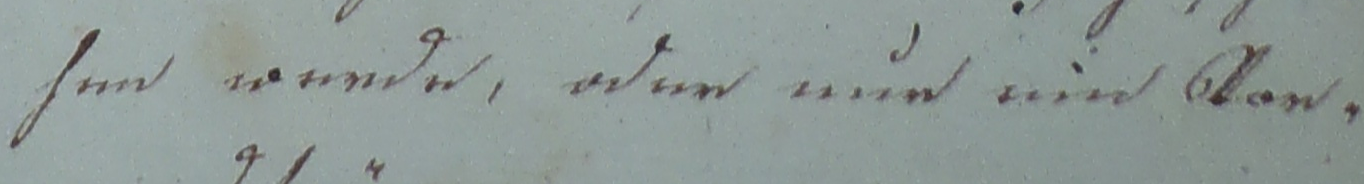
hen werde, oder nur ein Vor¬
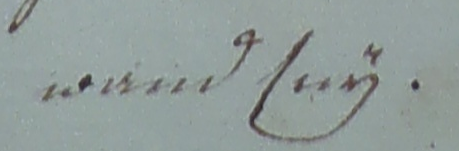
wand sey.
